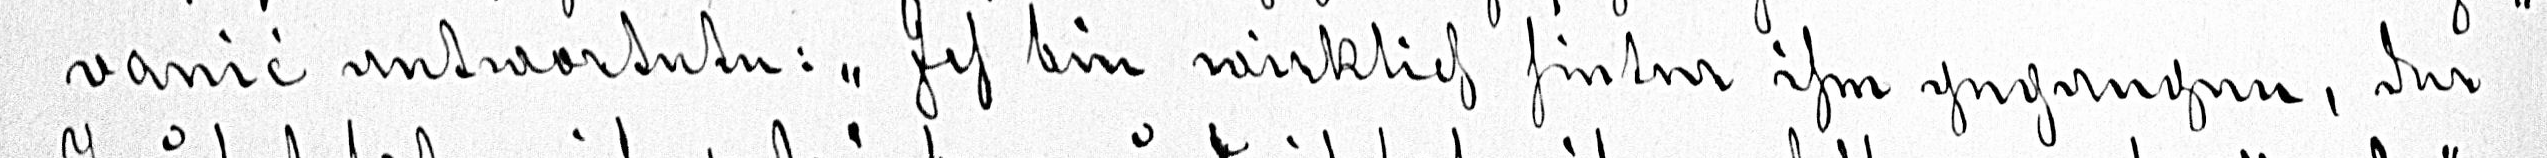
vanić antwortete: „Ich bin wirklich hinter ihm gegangen, der
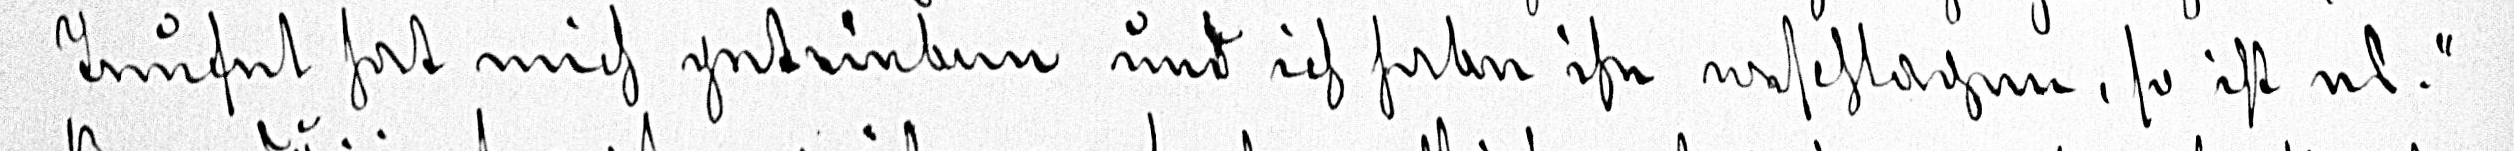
Teufel hat mich getrieben und ich habe ihn erschlagen, so ist es.“
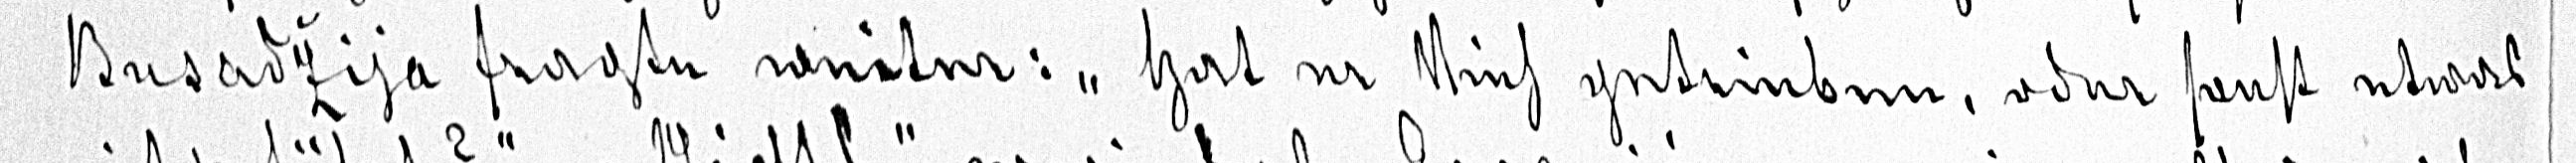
Busadžija fragte weiter: „Hat er Vieh getrieben, oder sonst etwas
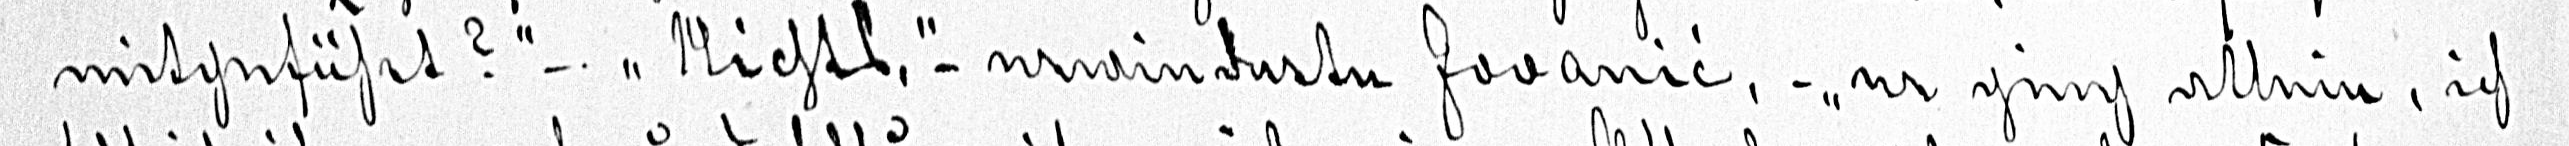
mitgeführt?“-. „Nichts,“- ermwienderteJovanić, -„er ging allein, ich
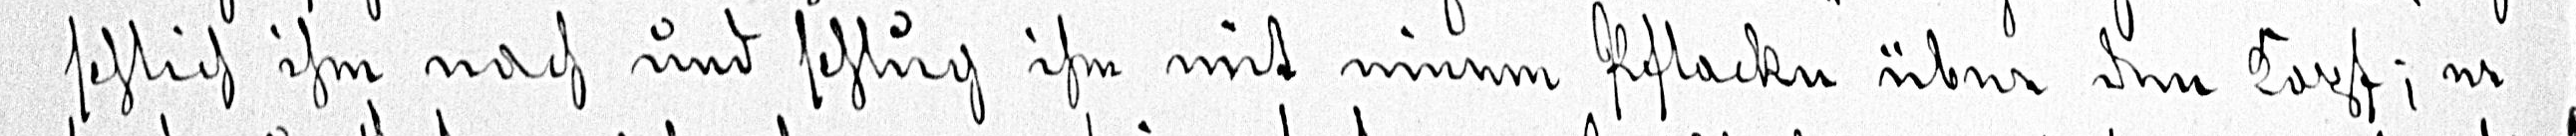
schlich ihm nach und schlug ihm mit einem Pflocke über den Kopf; er
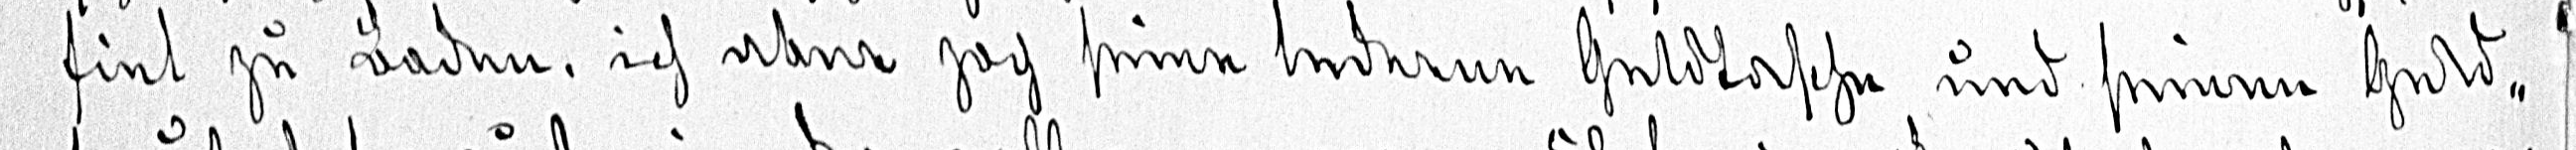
fiel zu Boden, ich aber zog seine lederne Geldtasche und seinen Geld¬
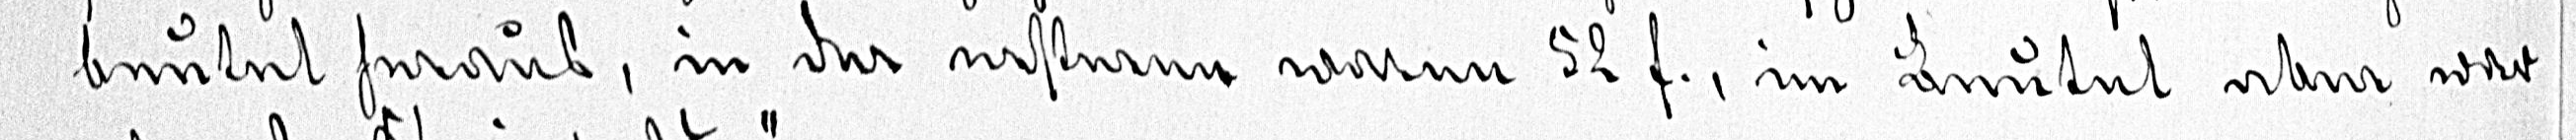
beutel heraus, in der ersteren waren 52 f., im Beutel aber war
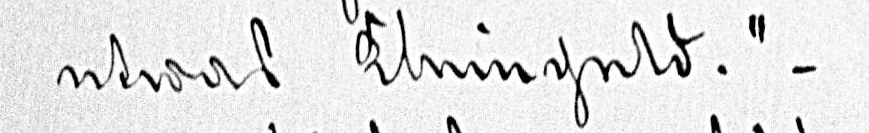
etwas Kleingeld.“-
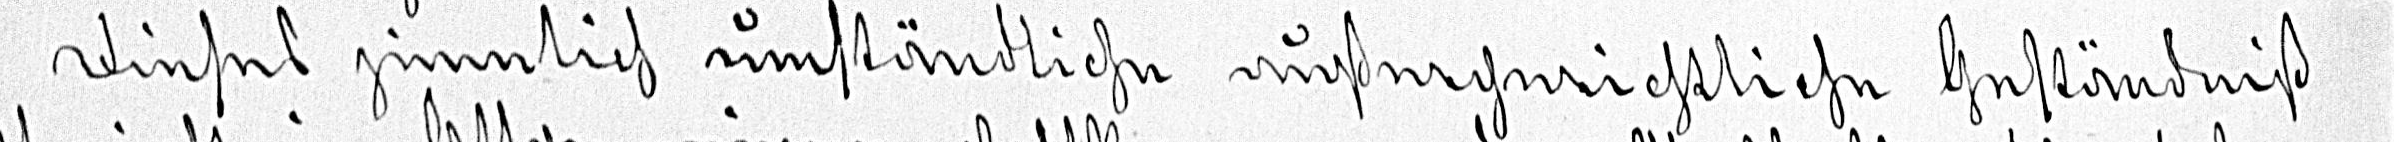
Dieses ziemlich umständliche außergerichtliche Geständniß
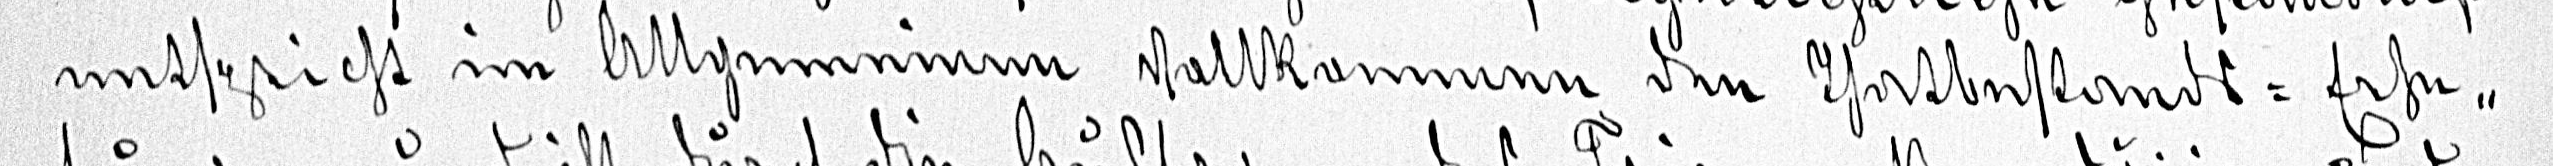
entspricht im Allgemeinen vollkommen den Thalbestands-Erhe¬
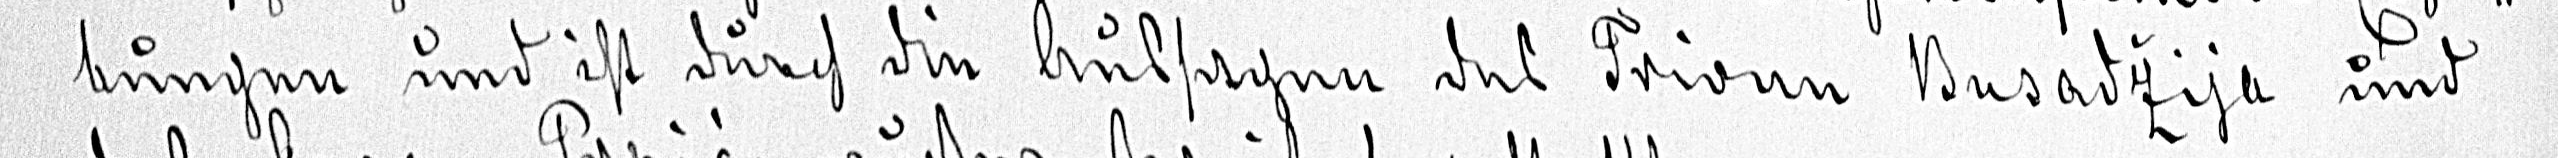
bungen und ist durch die Aussagen des TrivanBusadžija und
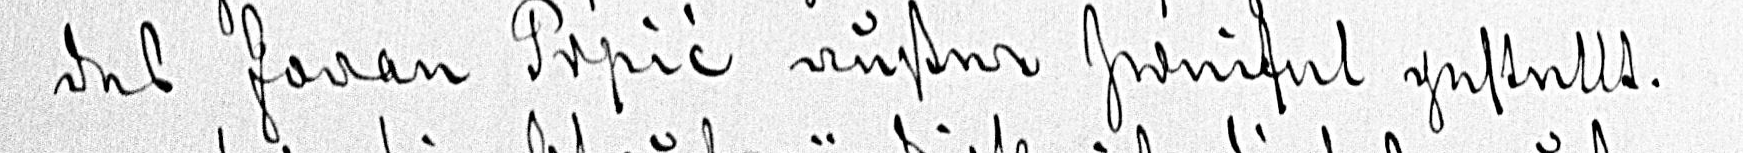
des Jovan Prpić außer Zweifel gestellt.
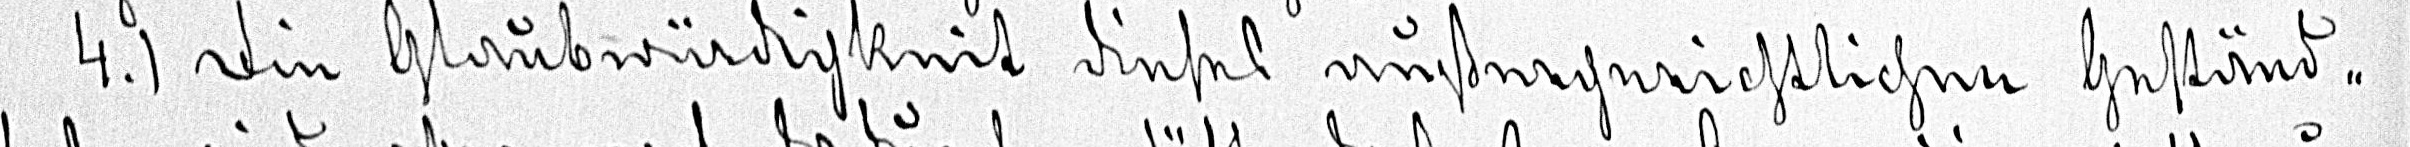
4.) Die Glaubwürdigkeit dieses außergerichtlichen Geständ¬
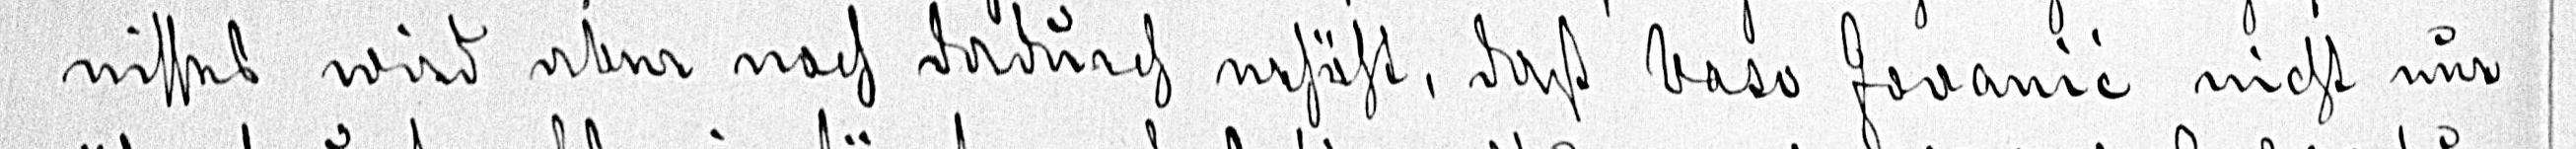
nisses wird aber noch dadurch erhöht, daß Vaso Jovanić nicht nur
